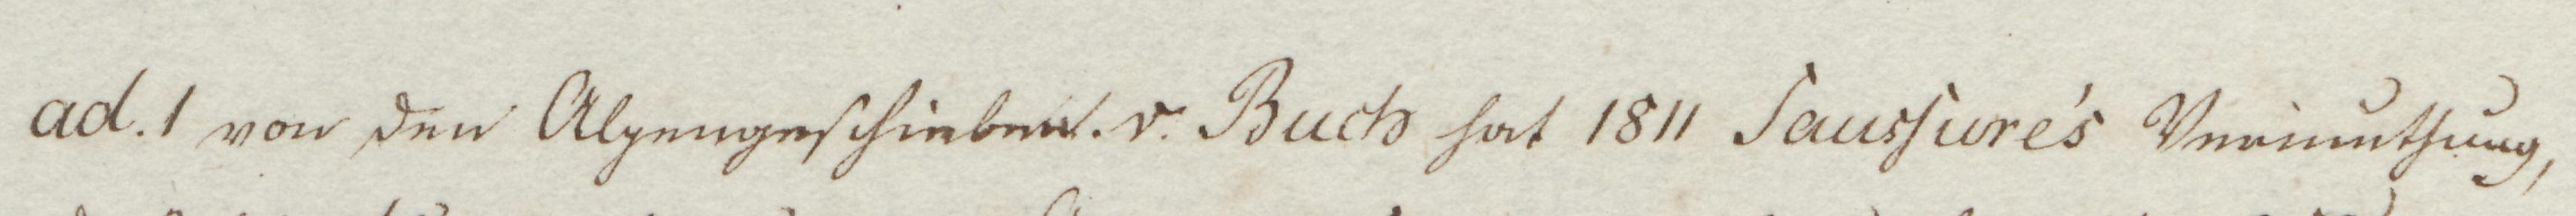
ad. 1 von den Alpengeschieben. v. Buch hat 1811 Saussure's Vermuthung,
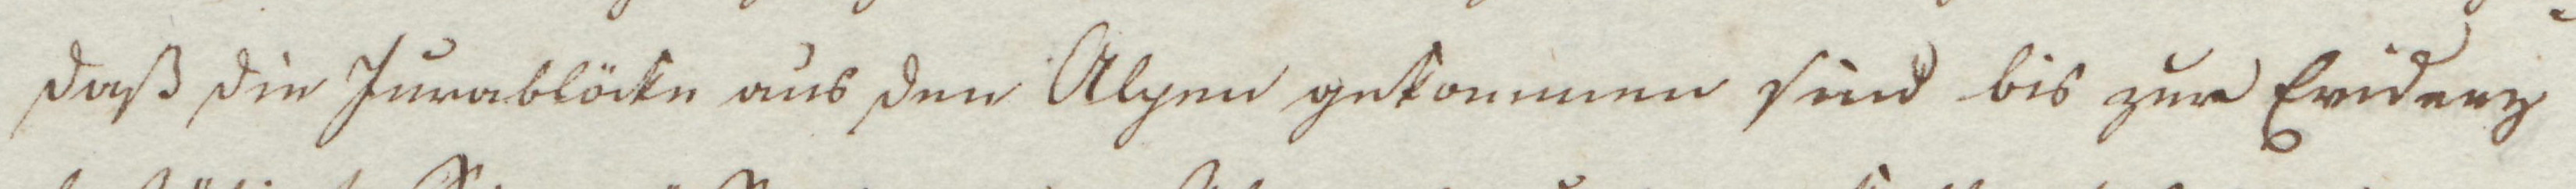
daß die Jurablöcke aus den Alpen gekommen sind bis zur Evidenz
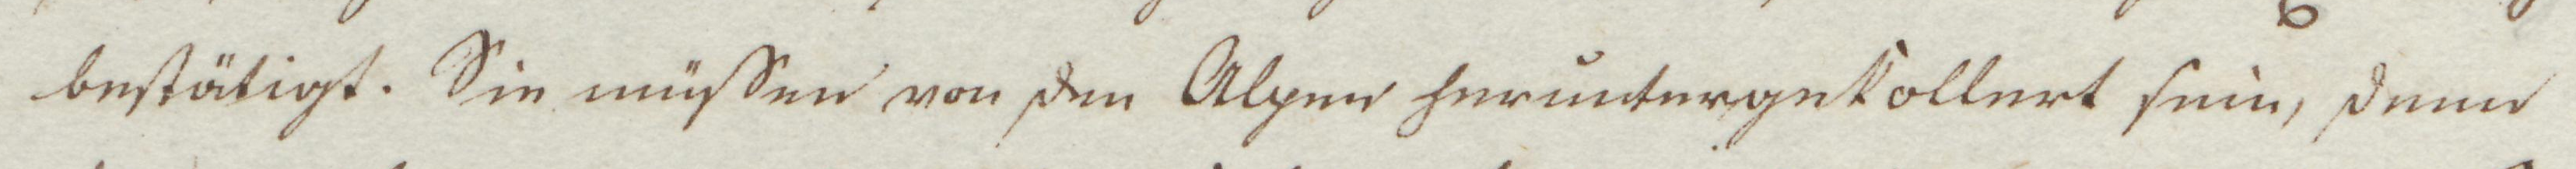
bestätigt. Sie müssen von den Alpen heruntergekollert sein, denn
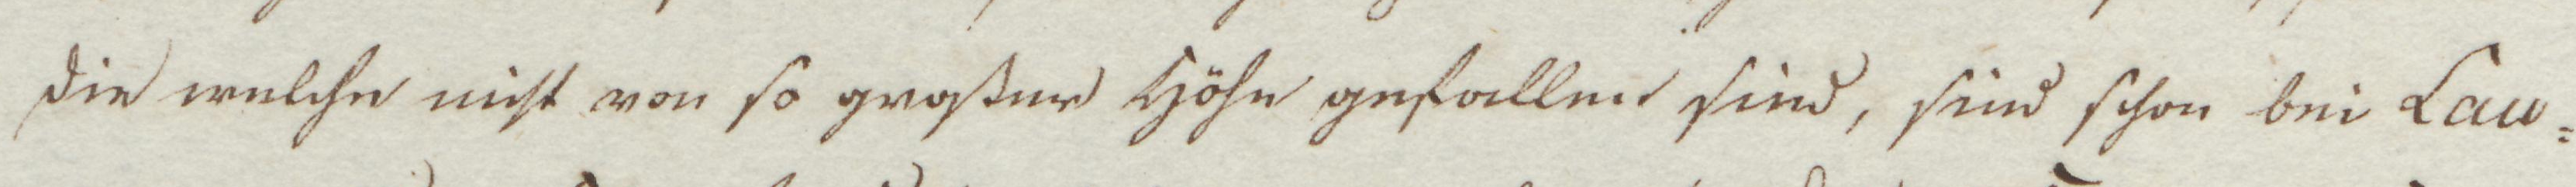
die welche nicht von so großer Höhe gefallen sind, sind schon bei Lau-
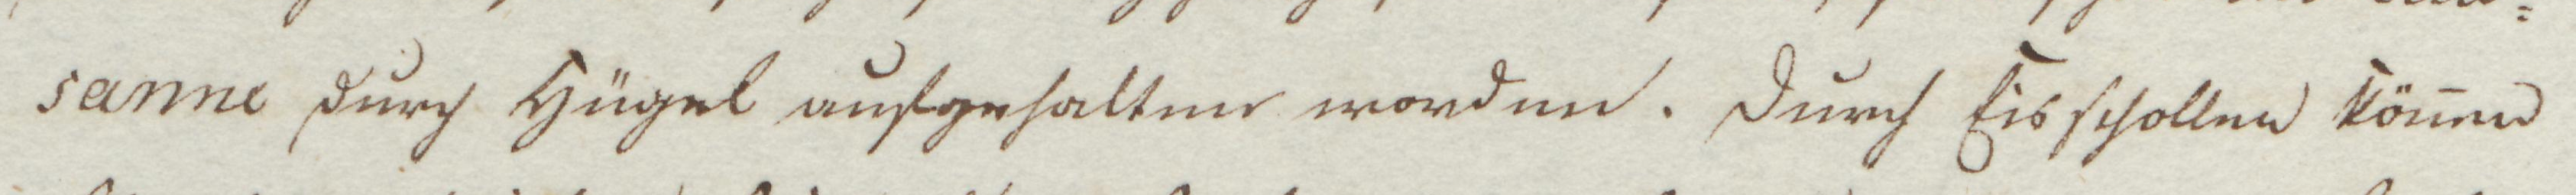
sanne durch Hügel aufgehalten worden. Durch Eisschollen köñen
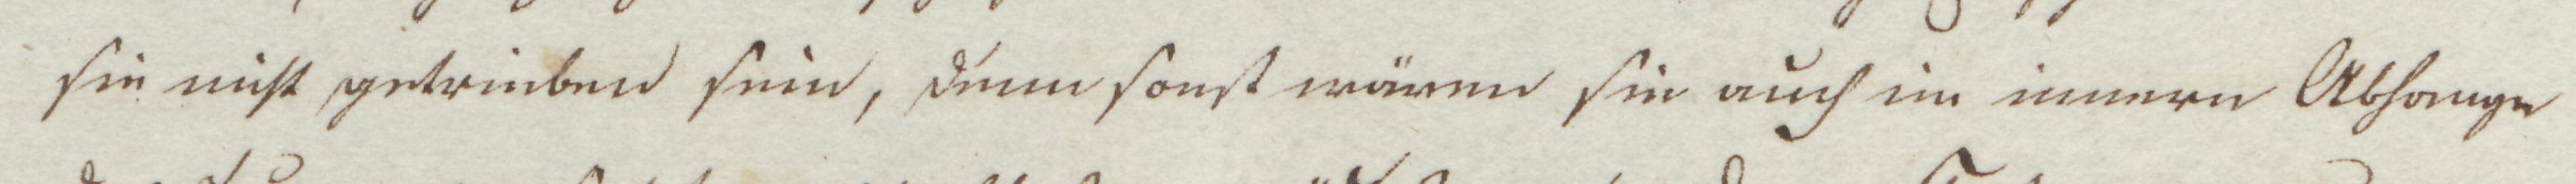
sie nicht getrieben sein, denn sonst wären sie auch im innern Abhange
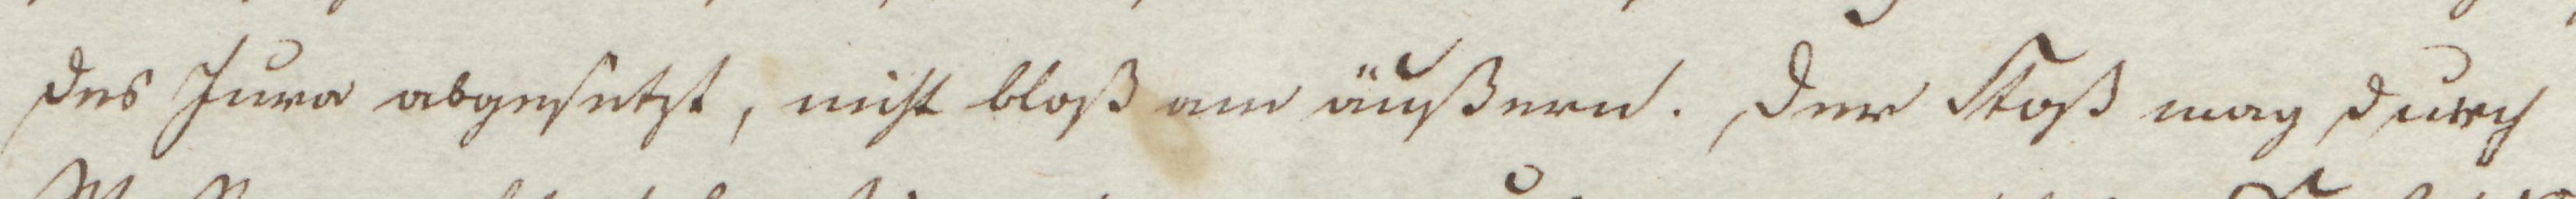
des Jura abgesetzt, nicht bloß am äußern. Der Stoß mag durch
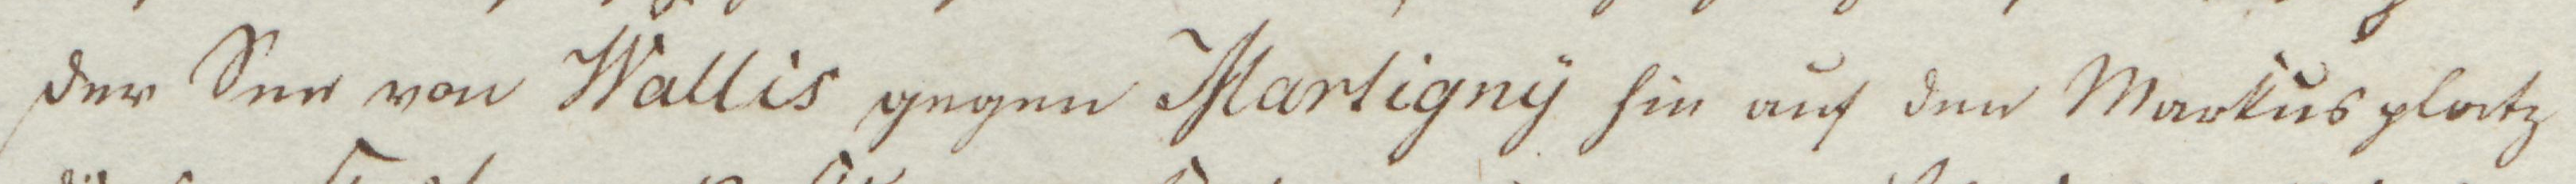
der See von Wallis gegen Martignÿ hin auf den Markusplatz
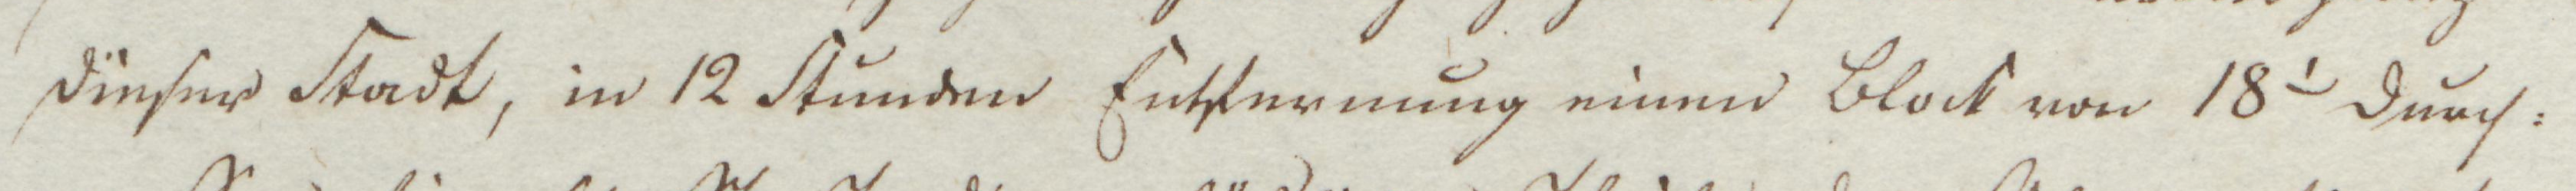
dieser Stadt, in 12 Stunden Entfernung einen Block von 18′ Durch-
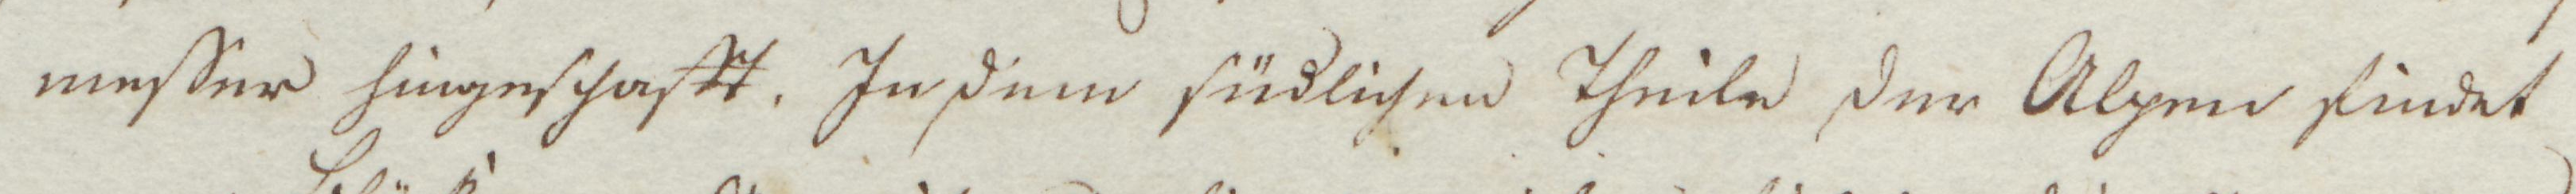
messer hingeschafft. In dem südlichen Theile der Alpen findet
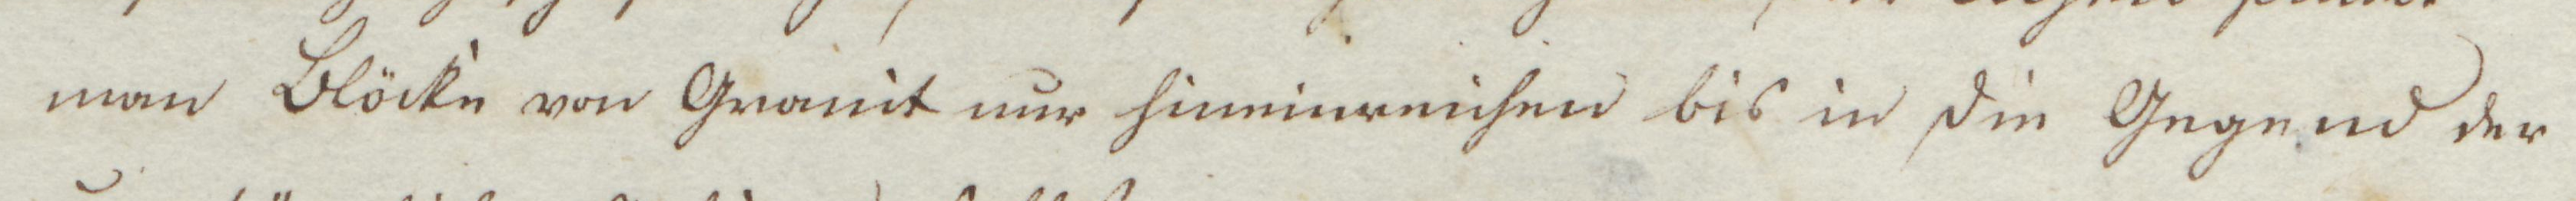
man Blöcke von Granit nur hineinreichen bis in die Gegend der
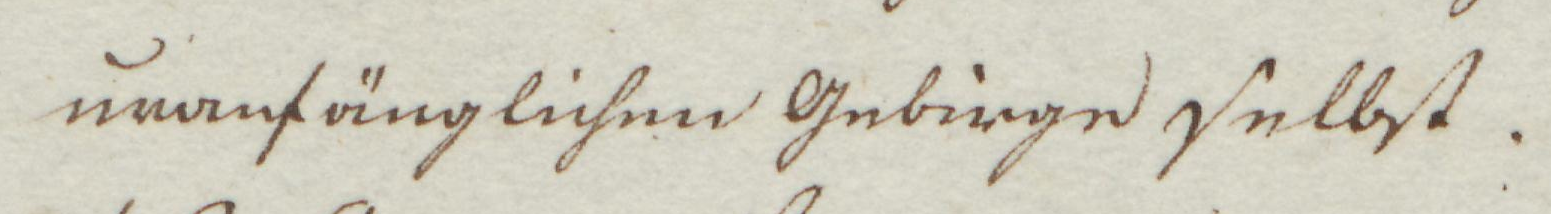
uranfänglichen Gebirge selbst.
